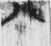八
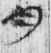月
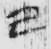己
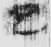巳
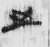之
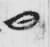日
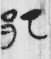○（鄖）
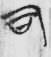司
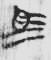馬
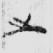之
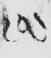州
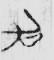加
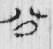公
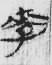李
